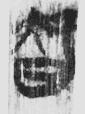智（知）
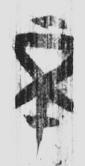不
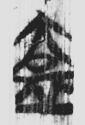盍（蓋）
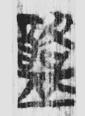○（酪）
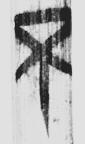不
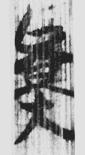○（酸）
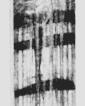王
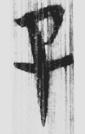子
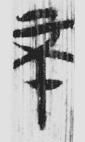不
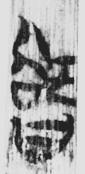智（知）
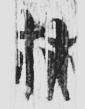○（麻）
